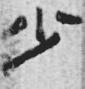少（小）
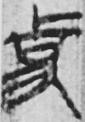弁
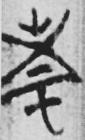考（巧）
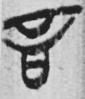言
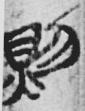則（則）
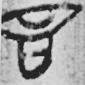言
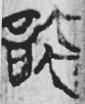○（讒）
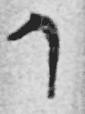人
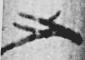之
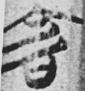害
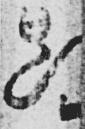也
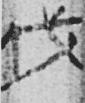伐
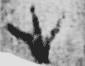木
